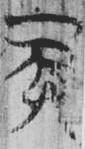而
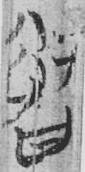智（知）
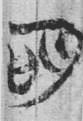名
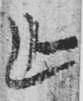亡（無）
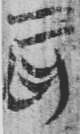耳
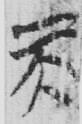而
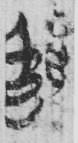○（聞）
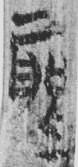聖（聲）
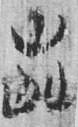卉（草）
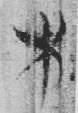木
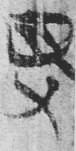○（得）
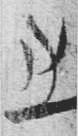之
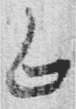㠯（以）
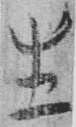生
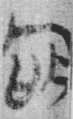含（禽）
